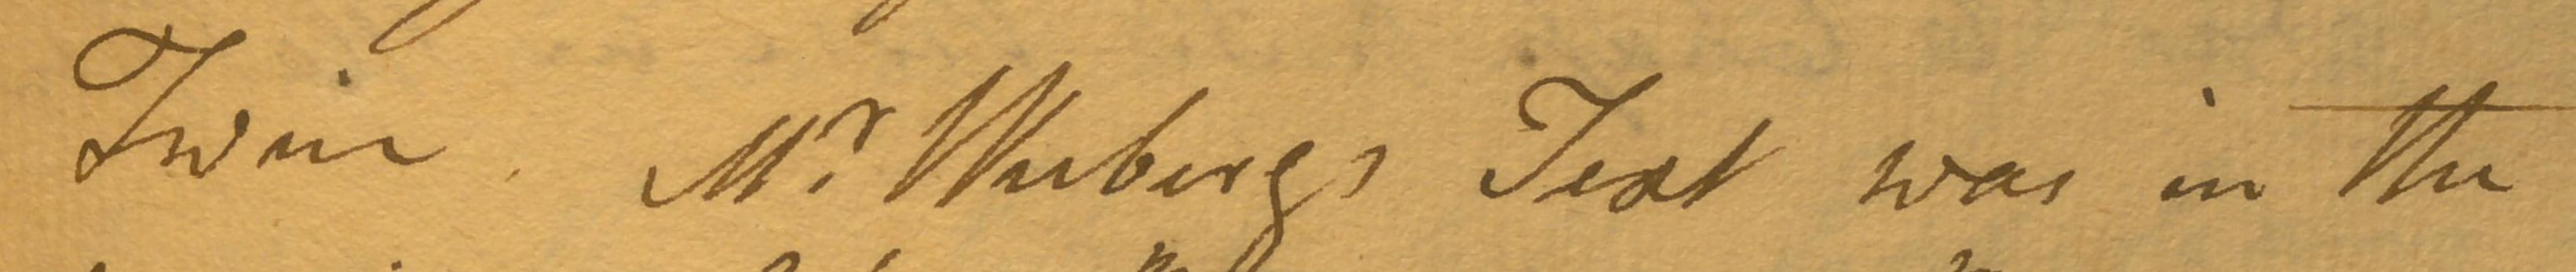Twice. M^r. Weibergs Text was in the
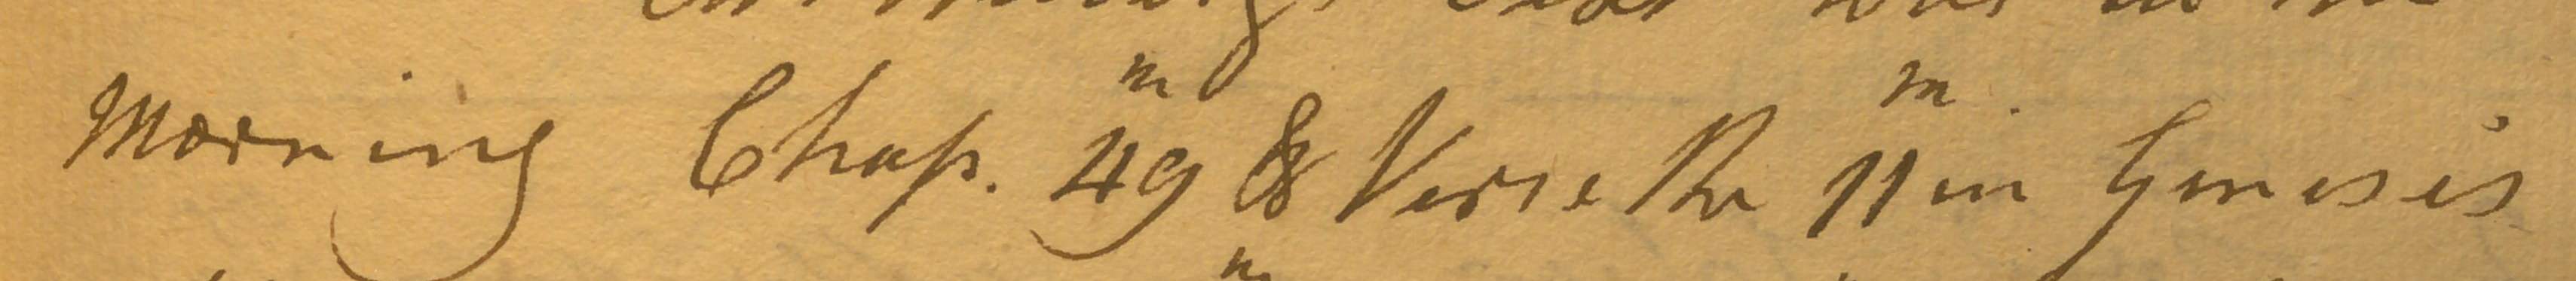Morning Chap. 49^th & Verse 11^th in Genesis
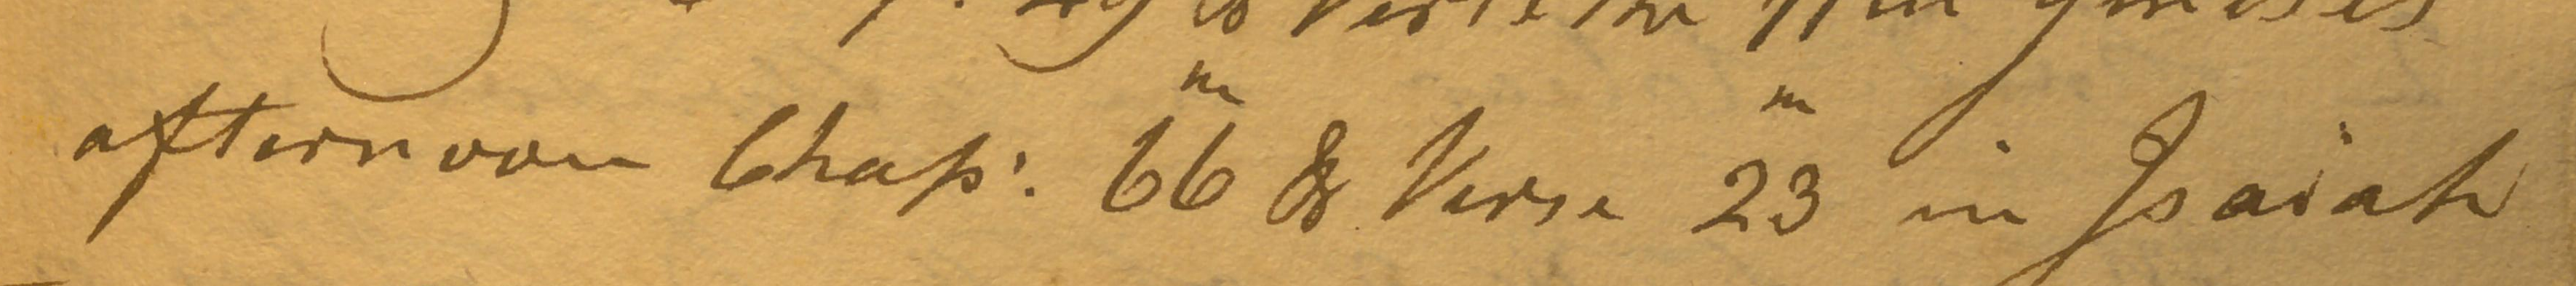afternoon Chap: 66^th & Verse 23^th in Isaiah
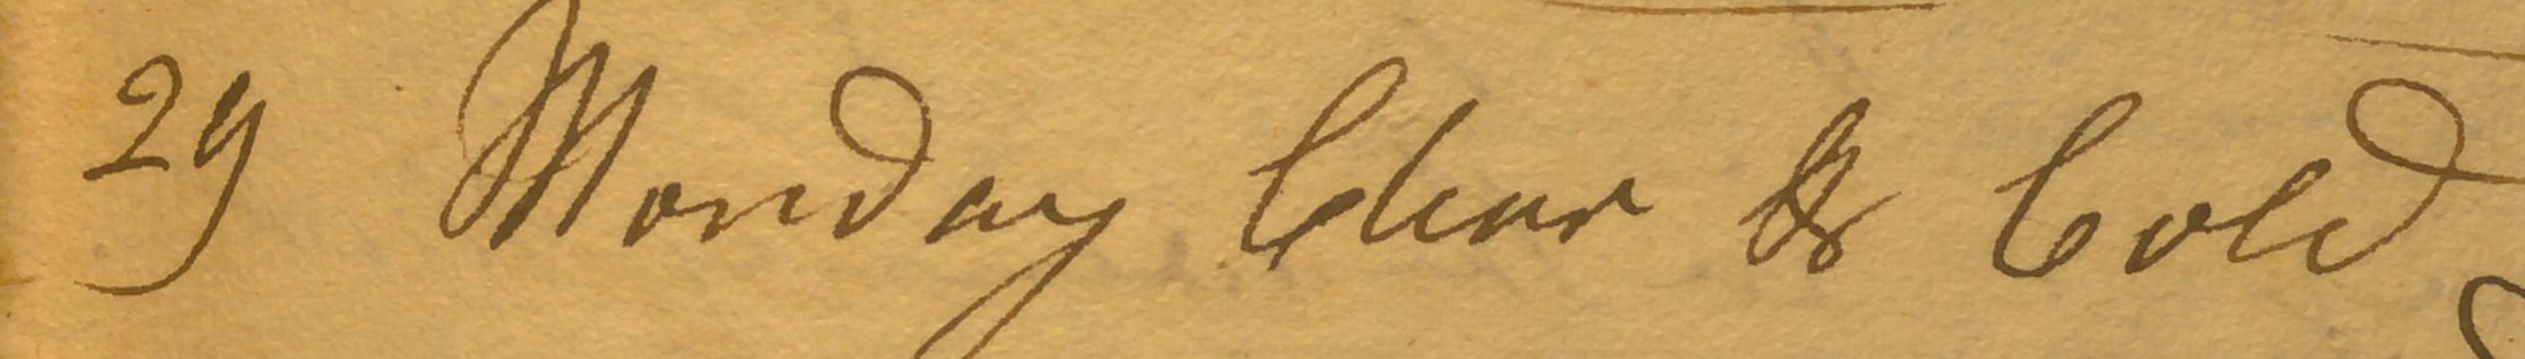29 Monday Clear & Cold
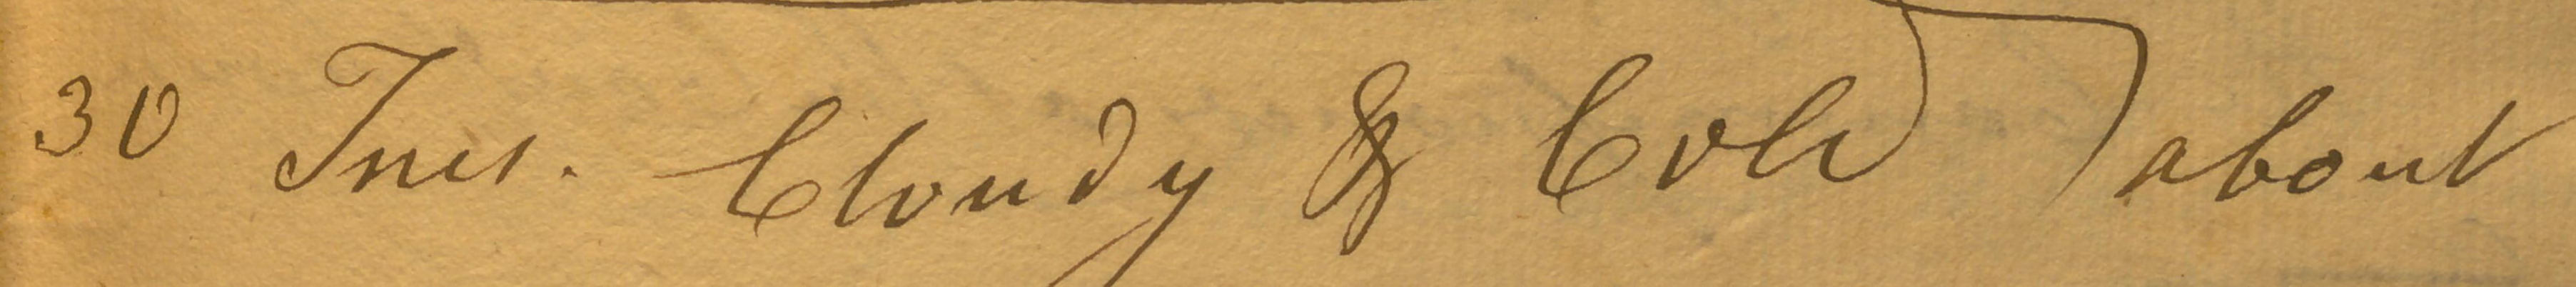30 Tues. Cloudy & Cole about
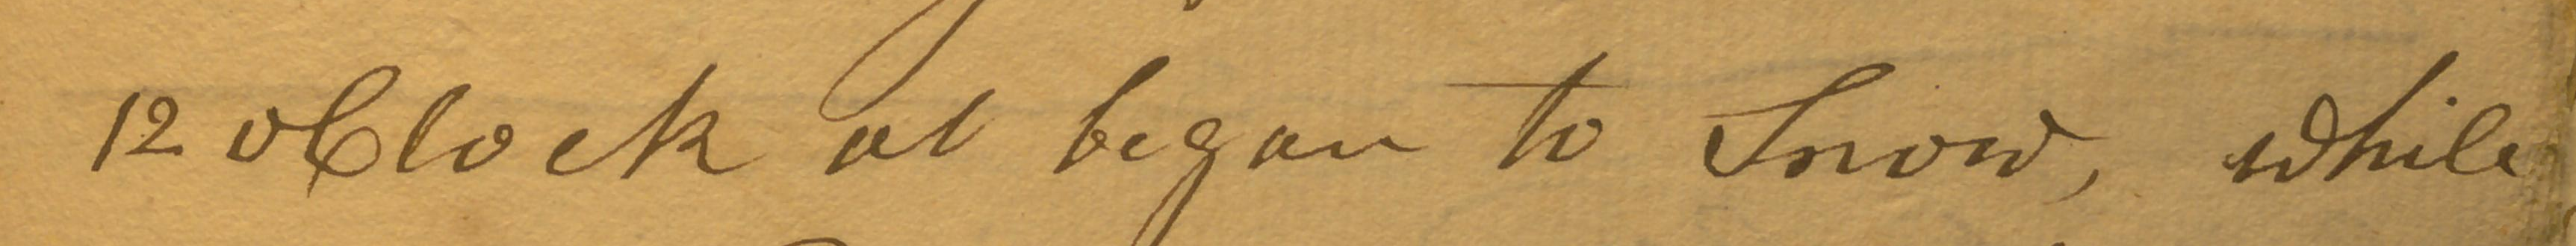12 oClock at began to Snow, while
